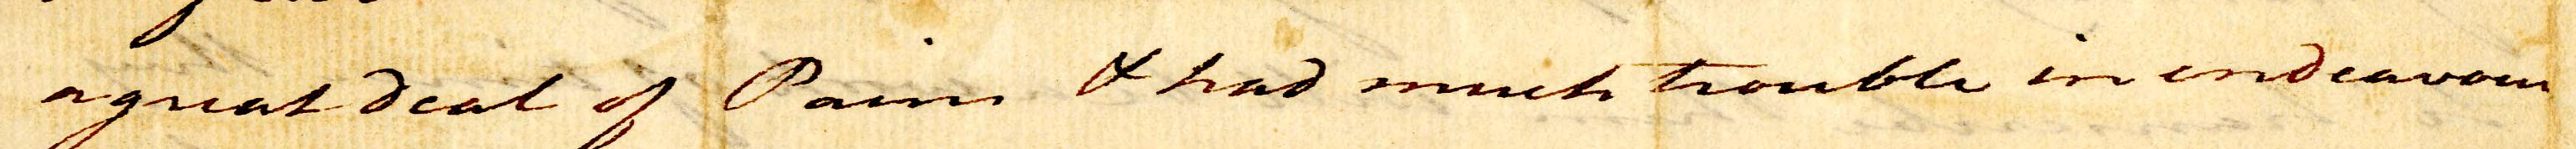a great deal of Pains & had much trouble in endeavour
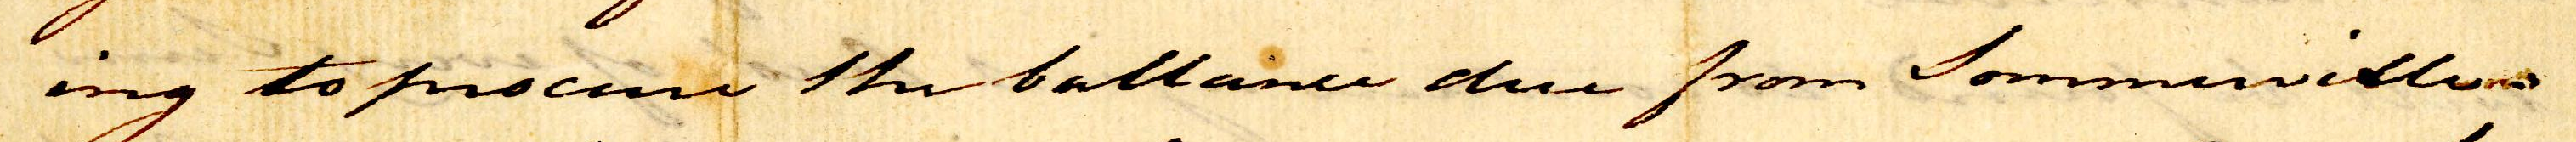ing to procure the ballance due from Sommerville
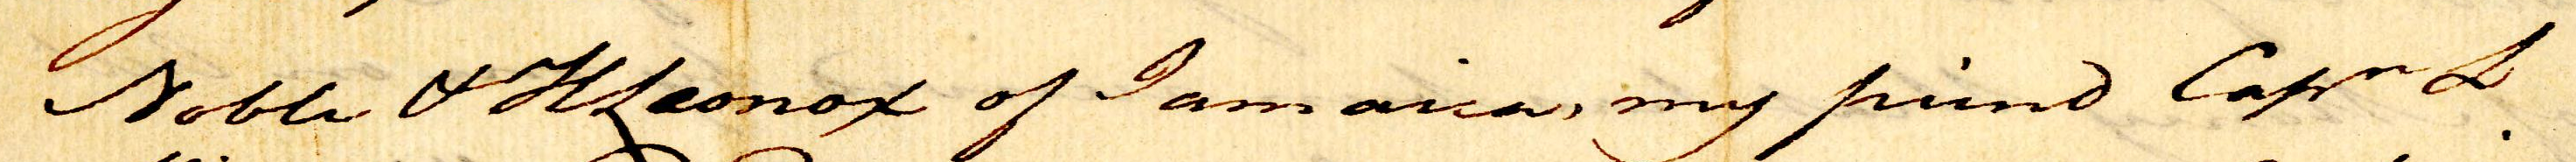Noble & H Leonox of Jamaica my friend Cap^n. L
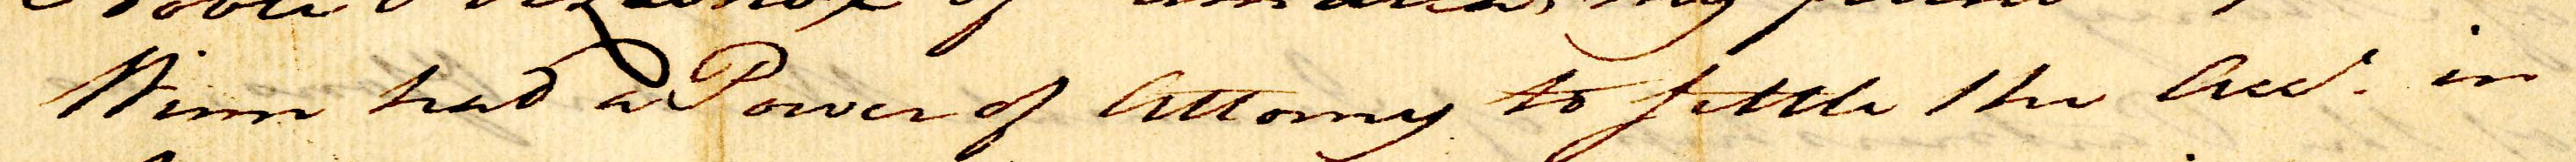Wim had a Power of Attorney to settle the Acc^t. in
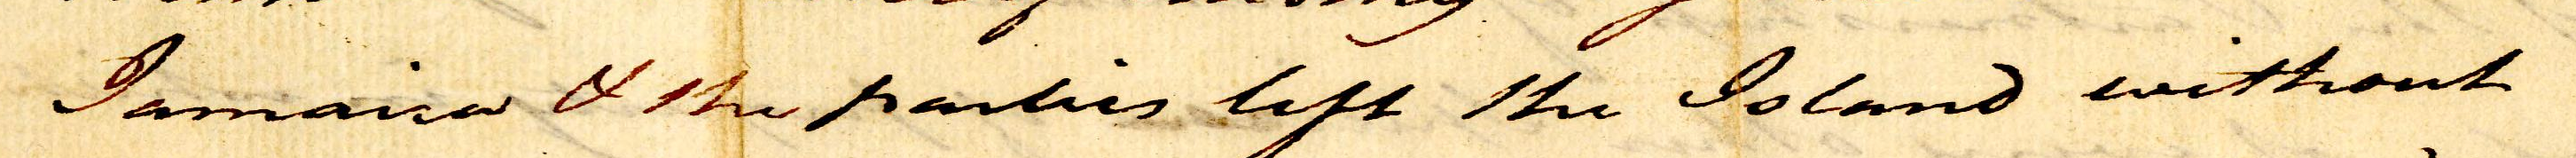Jamaica & the parties left the Island without
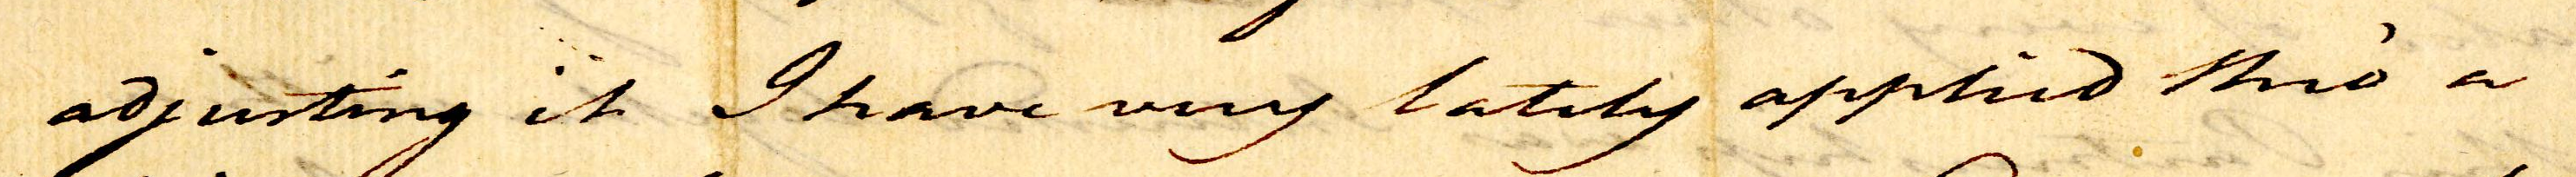adjusting it I have very lately applied thro' a
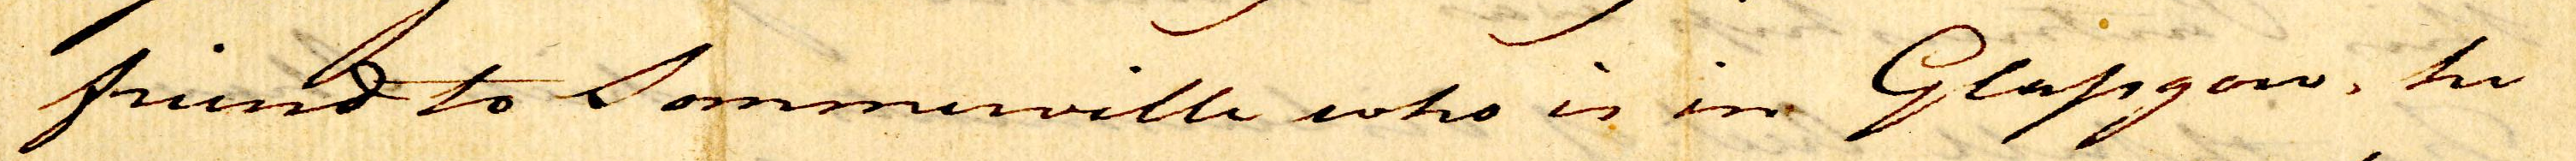friend to Sommerville who is in Glassgow. he
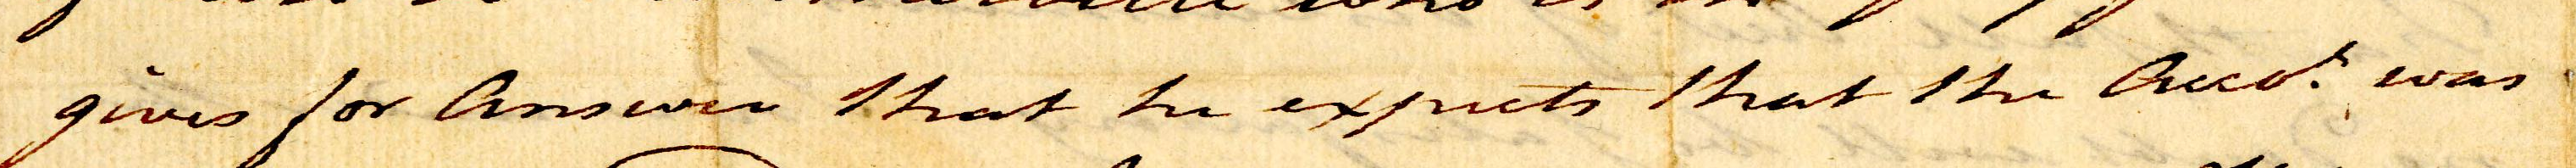gives for Answer that he expects that the Acco^t. was
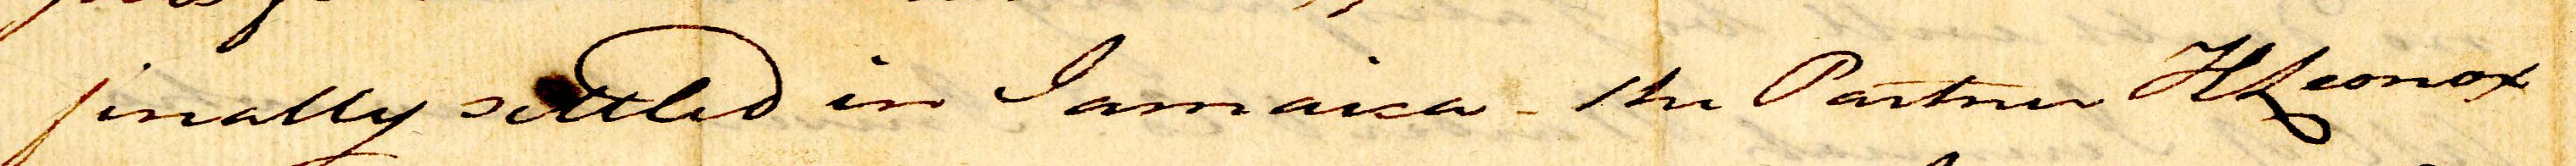finally settled in Jamaica- the Partner H Leonox
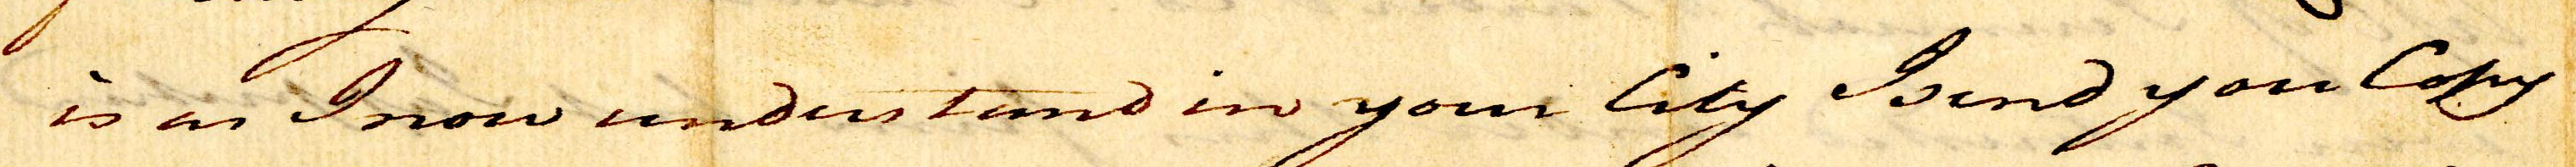is as I now understand in your City I send your Copy
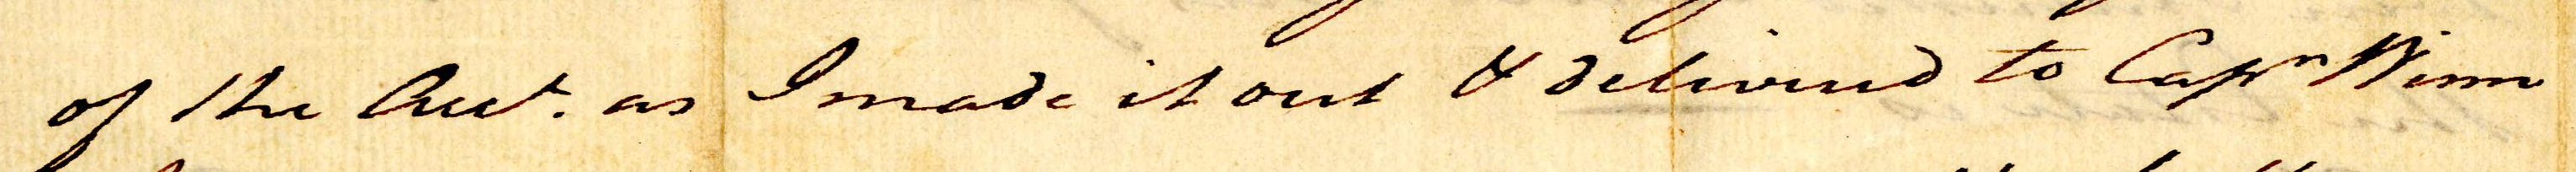of the Acc^t. as I made it out & delivered to Cap^n. Wim
